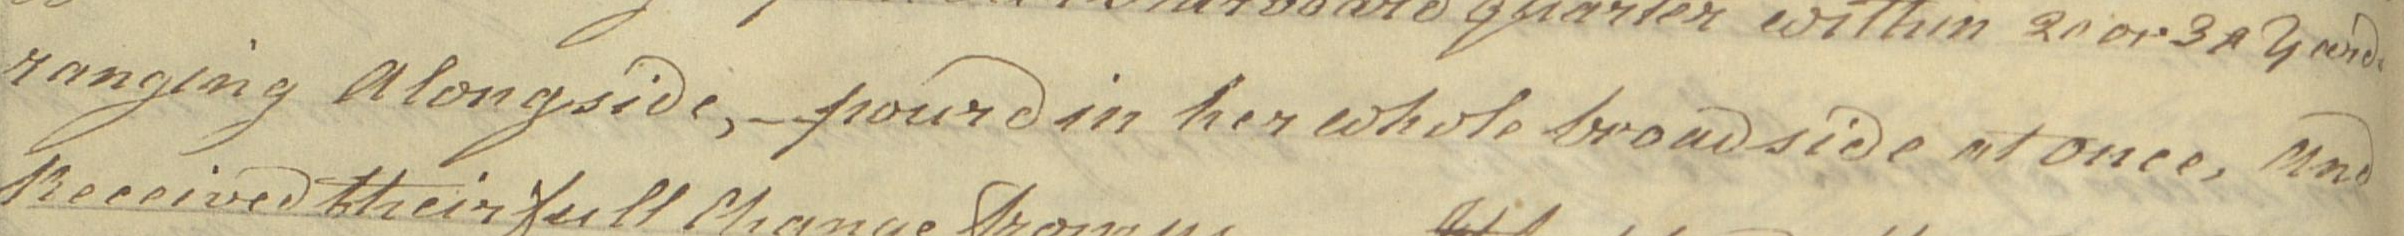ranging Alongside, pourd in her whole broadside at once, and
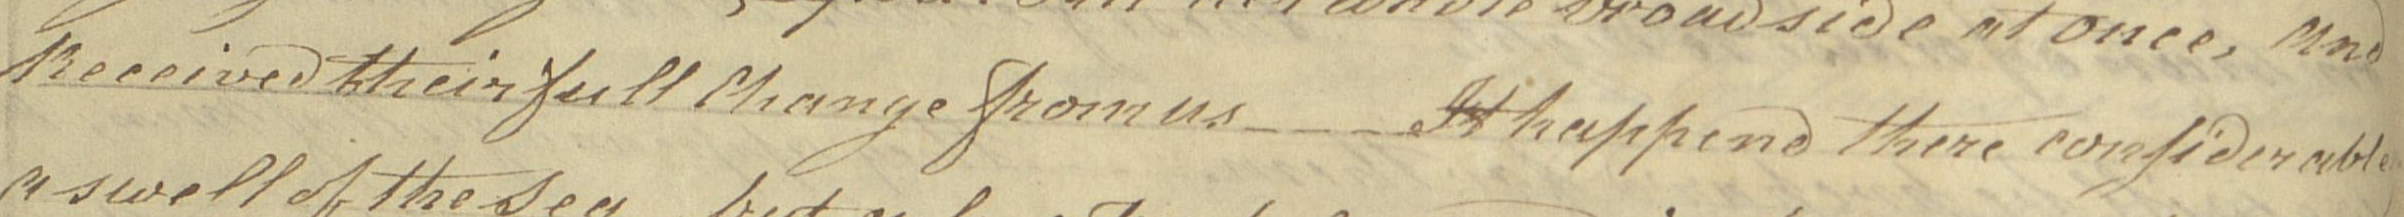Received their full Change From us It happend there considerable
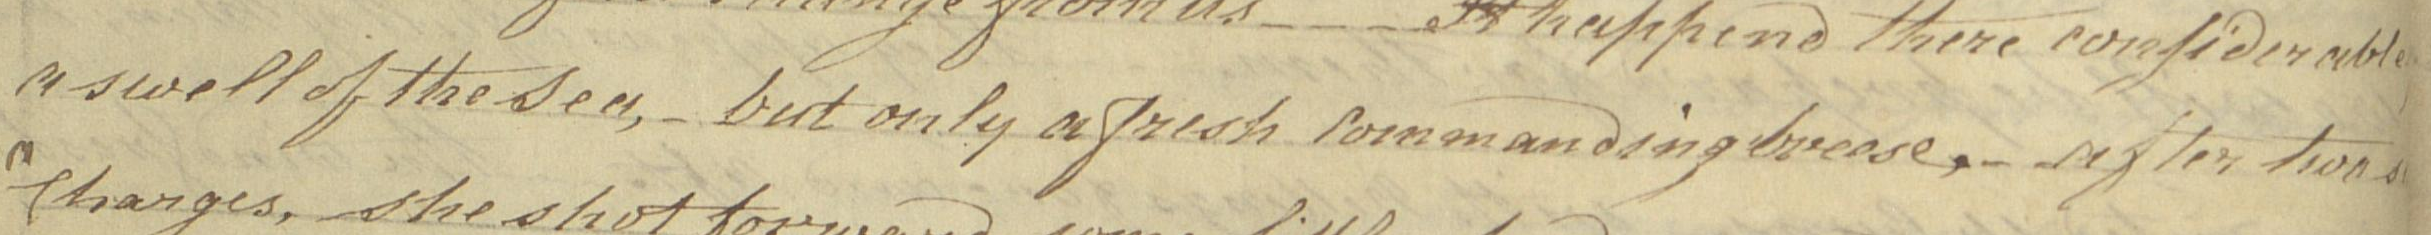as well of the sea, but only a fresh commanding breese. after two s-
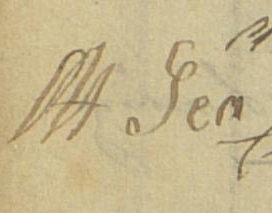M. Sea
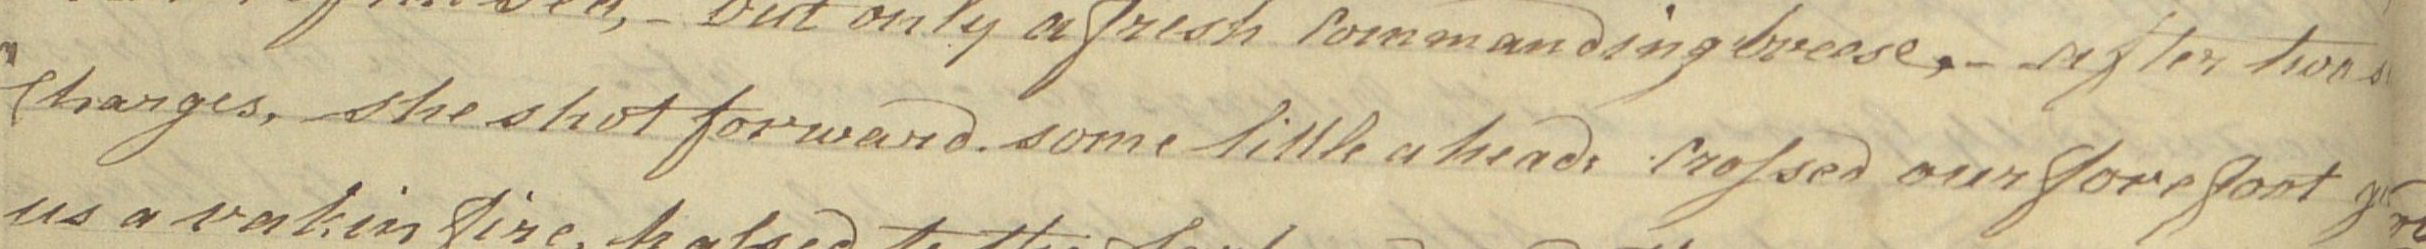Charges, she shot forward. some little aheads crossed our forefont g-
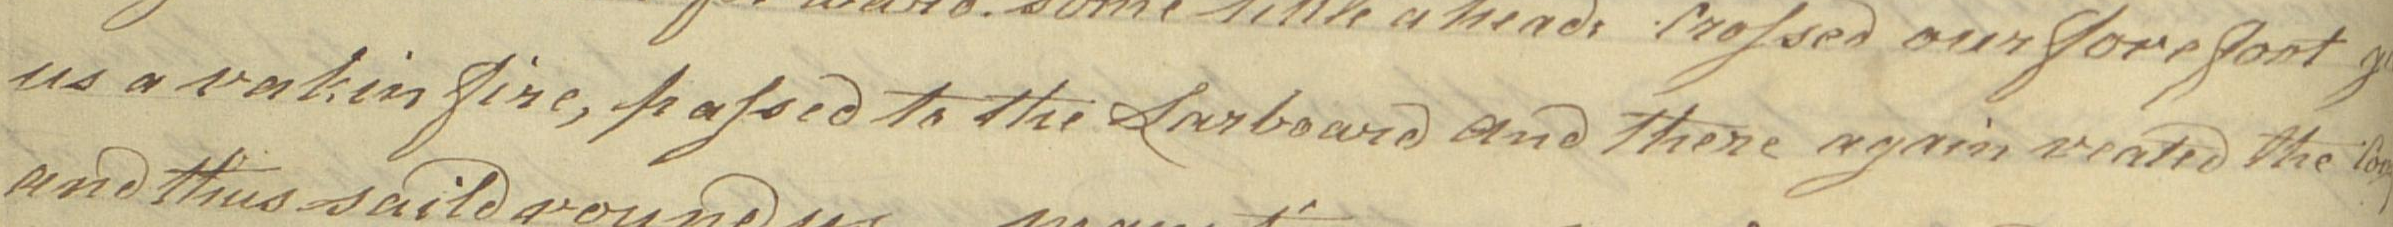us a rakin fire, passed to the Larboard and there again vented the C-
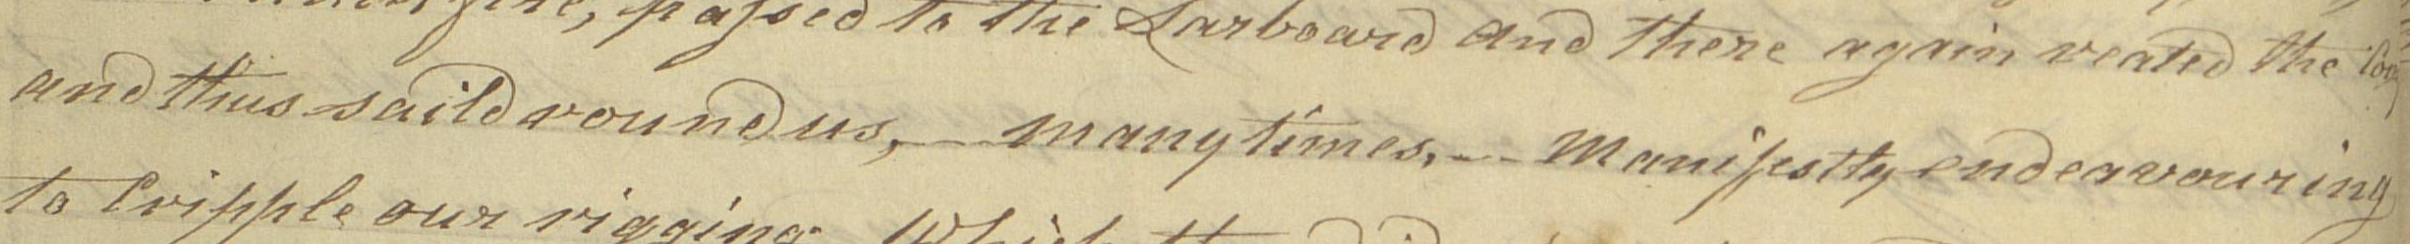and thus saild round us, many times, Manifestly endeavouring
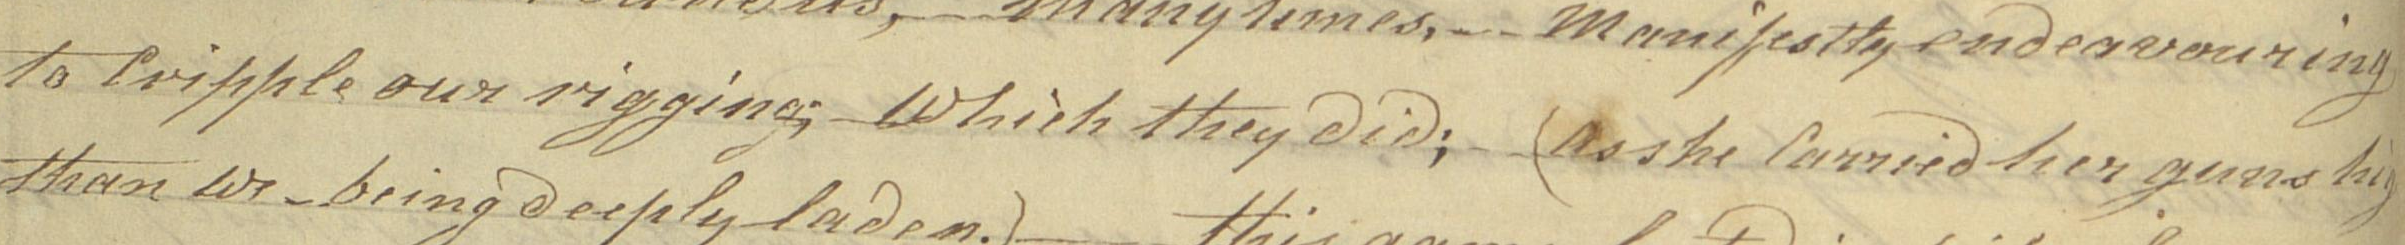to Cripple our rigging; which they did; (As he carried her guns he-
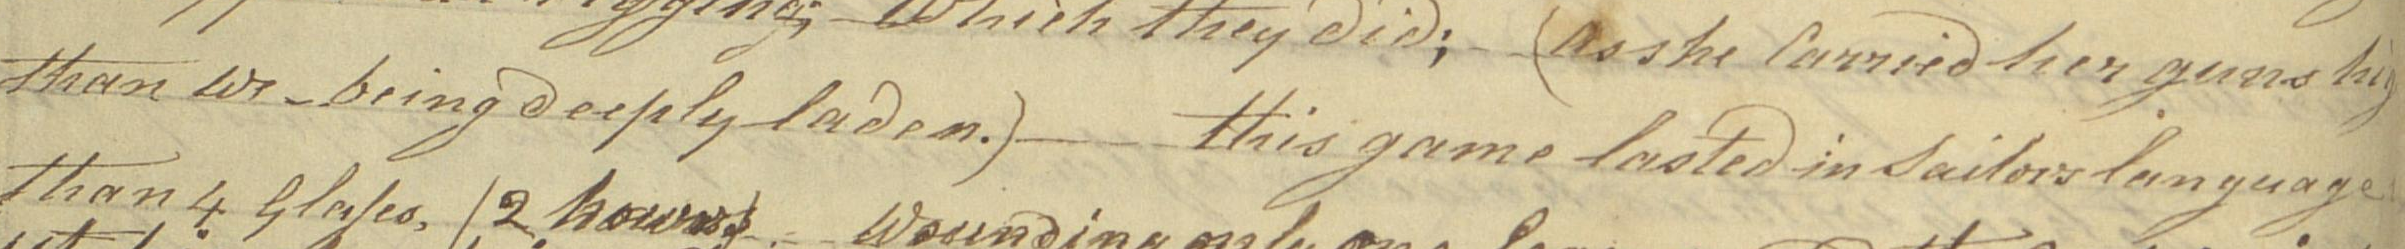than W. being deeply laden.) this game lasted in Sailors language
